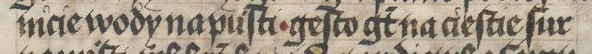nicie wody na puẛti.geẛto ḡt na cieẛtie ſur¬
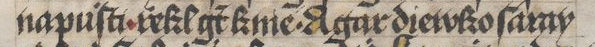na puẛti.ṙekl ḡt knie.A gar diewko ſaray
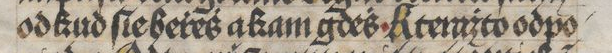odkud ſie beṙeṡ a kam gdeṡ.Kterażto odpo¬
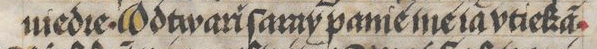uiedie.Odtwaři ſaray panie mé ia vtiekā.
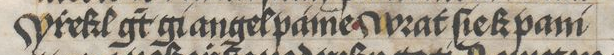Yṙekl ḡt gi angel pánie.Wraṫ ſie k paní
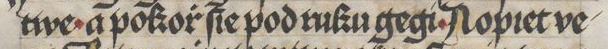twe.a pokoṙ ſie pod ruku gegi.A opiet ve¬
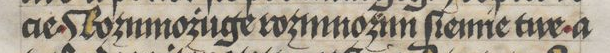cie.Rozmożuge rozmnożim ſiemie twe.a
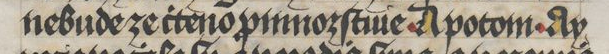nebude że ċteno ꝓmnozſtuie.A potom.Ay
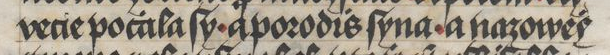vecie poċala ſy.a porodiṡ ſyna.a nazoweṡ
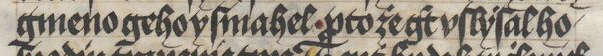gmeno geho y ſmahel.ꝓto że ḡt yſlyẛal ho¬
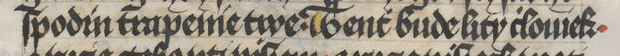ſpodin trapenie twe.Tenṫ bude lity ċlouiek.
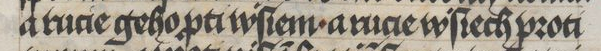a rucie geho ꝓti wẛiem.a rucie wẛiech proti
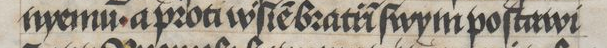nyemu.a proti wẛiē bratṙi ſwym poſtawi
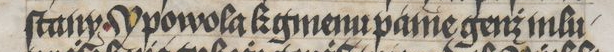ſtany.Y powola kgmenu panie genż mlu¬
